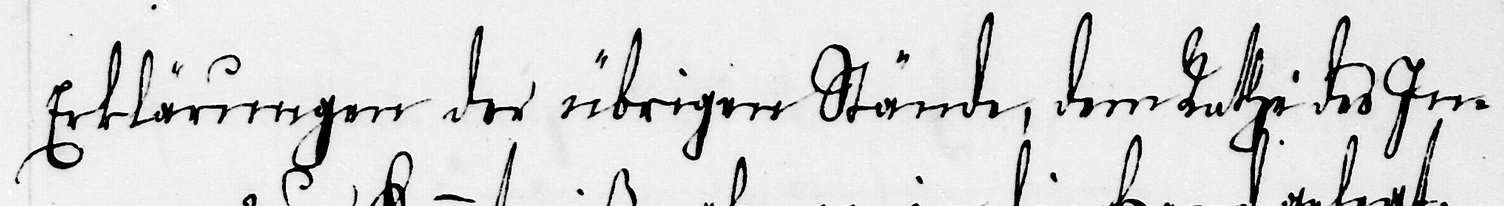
Erklärungen der übrigen Stände, dem Rathe des In¬
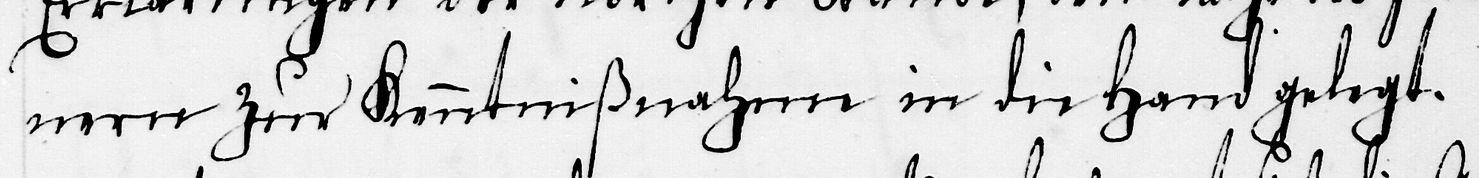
nern zur Kenntnißnahme in die Hand gelegt.
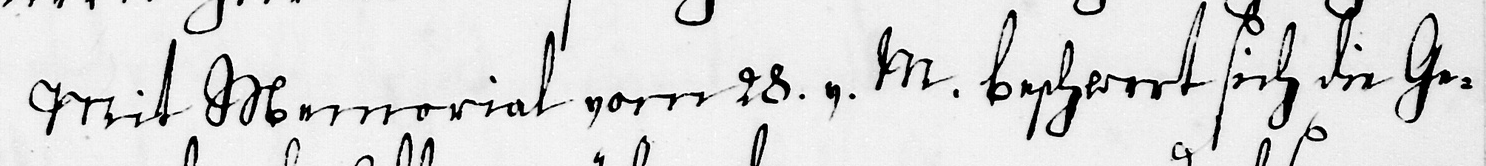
Mit Memorial vom 28. v. M. beschwert sich die Ge¬
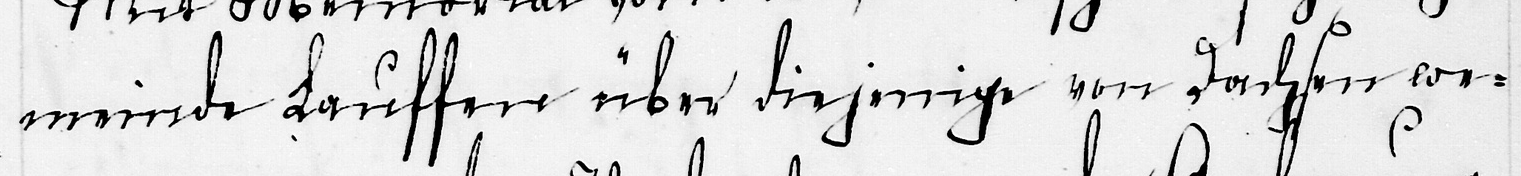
meinde Lauffen über diejenige von Dachsen we¬
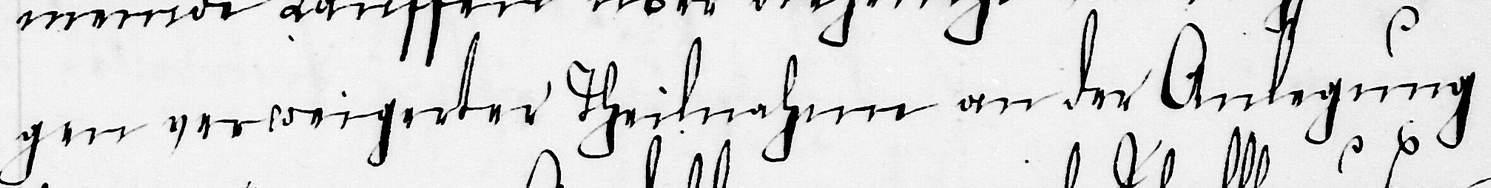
gen verweigerter Theilnahme an der Anlegung
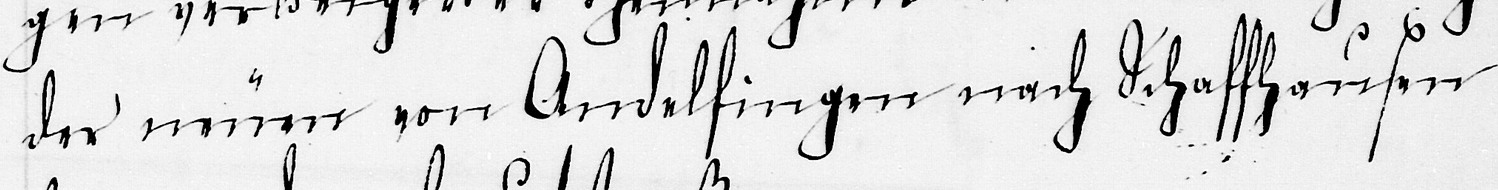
der neuen von Andelfingen nach Schaffhausen
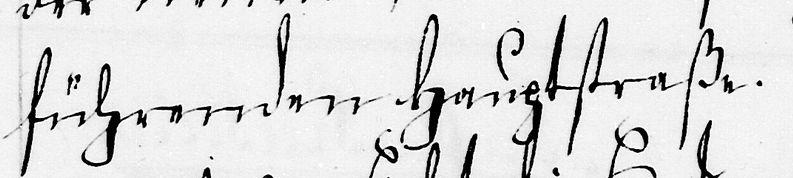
führenden Hauptstraße.
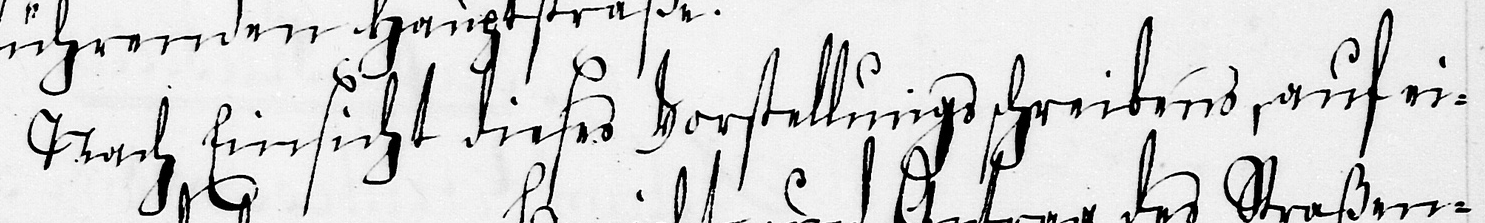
Nach Einsicht dieses Vorstellungsschreibens, auf ei¬
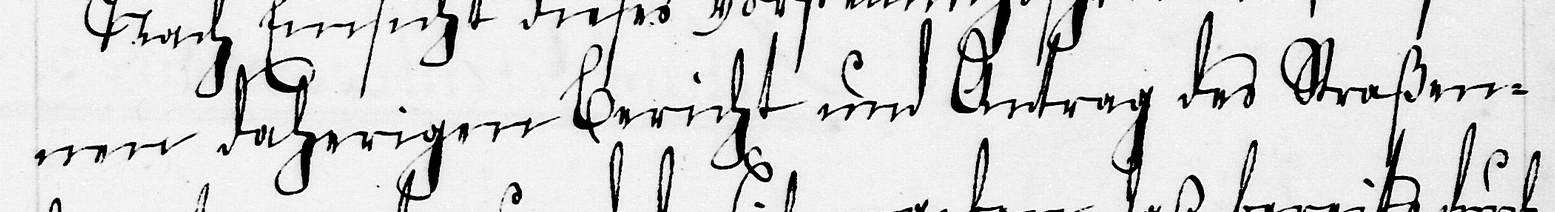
nen daherigen Bericht und Antrag des Straßen¬
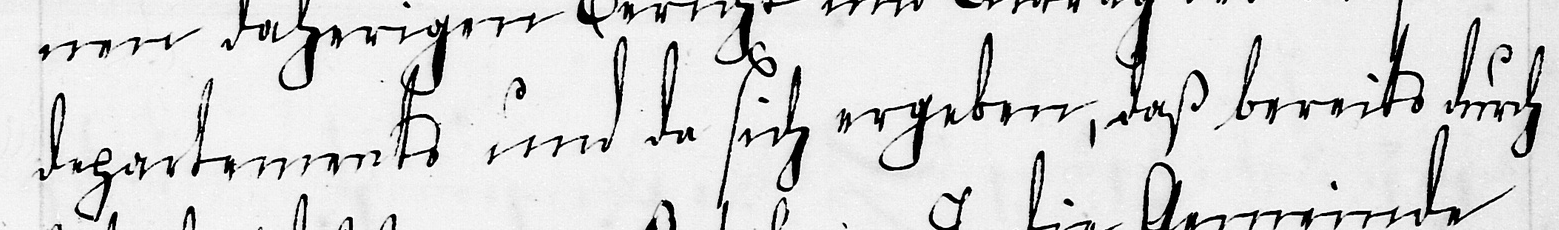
departements und da sich ergeben, daß bereits durch
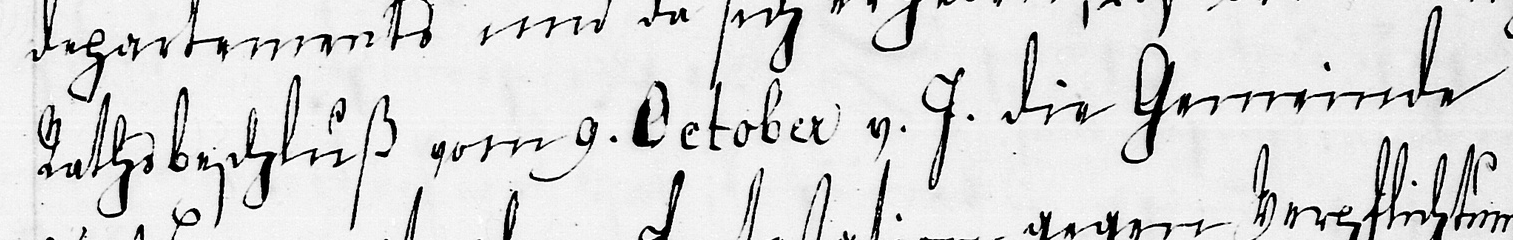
Rathsbeschluß vom 9. October v. J. die Gemeinde
